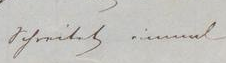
Schreitet einmal
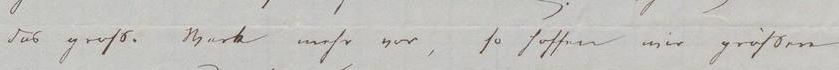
das große Werk mehr vor, so hoffen wir größere
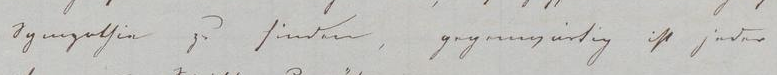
Sympathie zu finden, gegenwärtig ist jeder
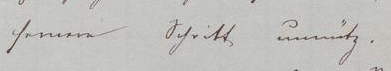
fernere Schritt unnütz.
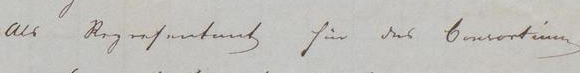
Als Representant für das Consortium
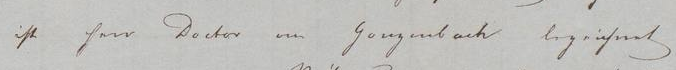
ist Herr Doctor von Gonzenbach bezeichnet.
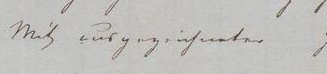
Mit ausgezeichneter
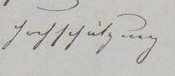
Hochschätzung
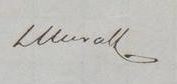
Muralt
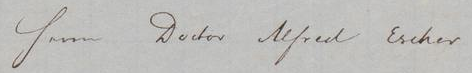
Herr Doctor Alfred Escher
